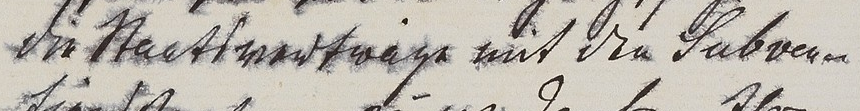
die Staatsverträge mit den Subven-
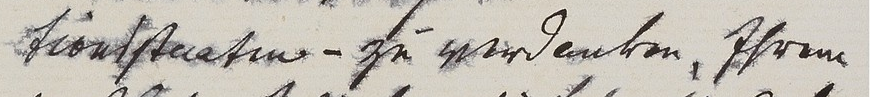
tionsstaaten – zu verdanken, Ihrem
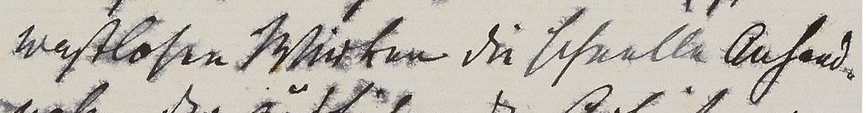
rastlosen Wirken die schnelle Anhand-
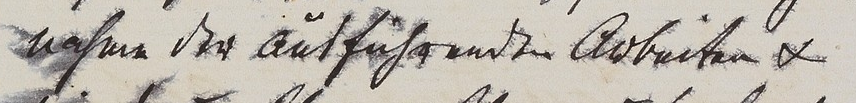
nahme der ausführenden Arbeiten &
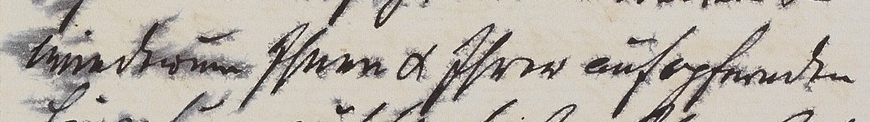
wiederum Ihnen & Ihrer aufopfernden
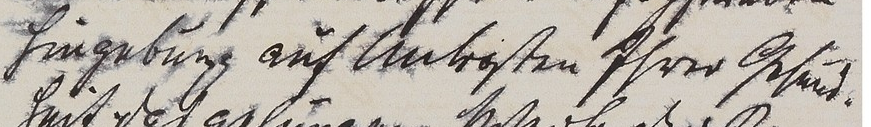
Hingebung auf Unkosten Ihrer Gesund-
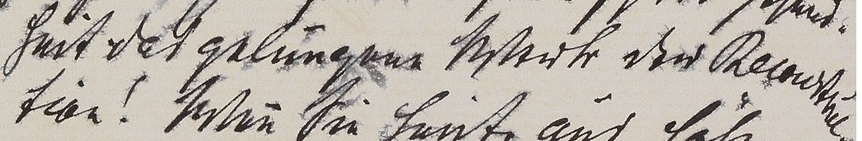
heit das gelungene Werk der Reconstruc-
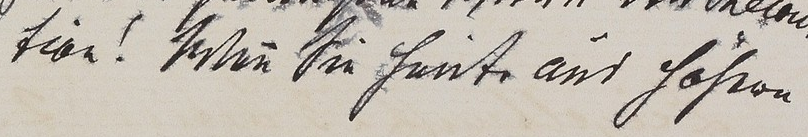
tion! Wenn Sie heute aus höhern
